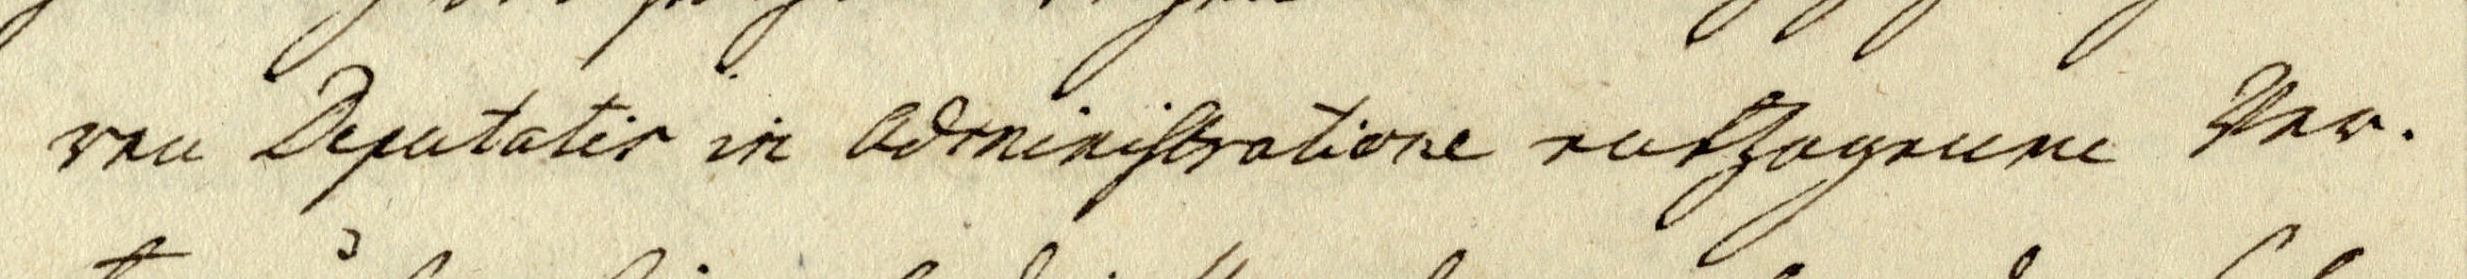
ren Deputatis in Administratione entzogenen Ver¬
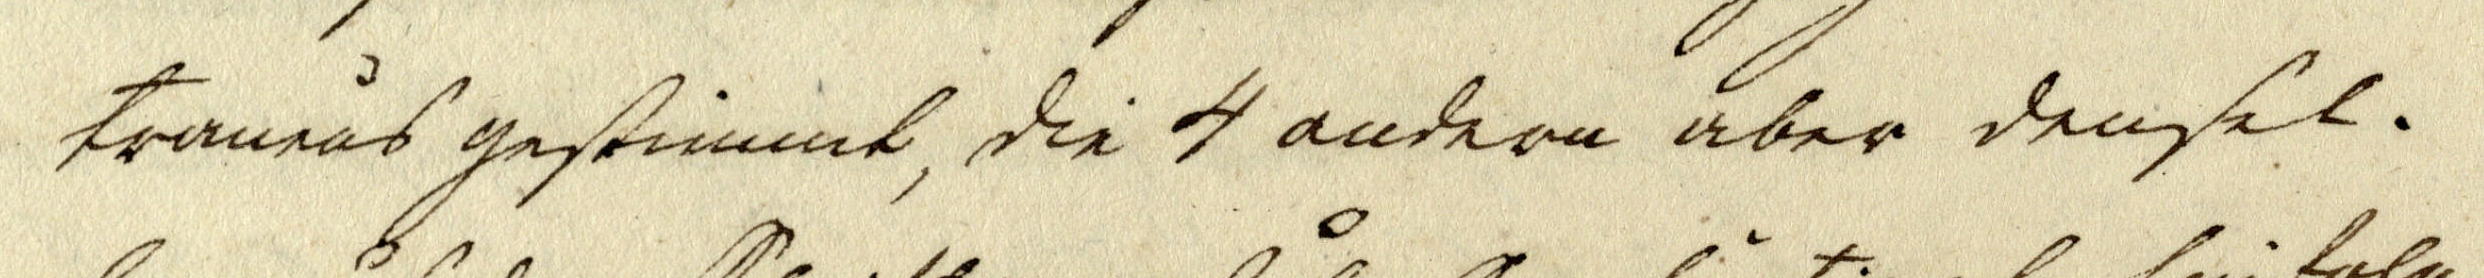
trauens gestimmt, die 4 andern aber densel¬
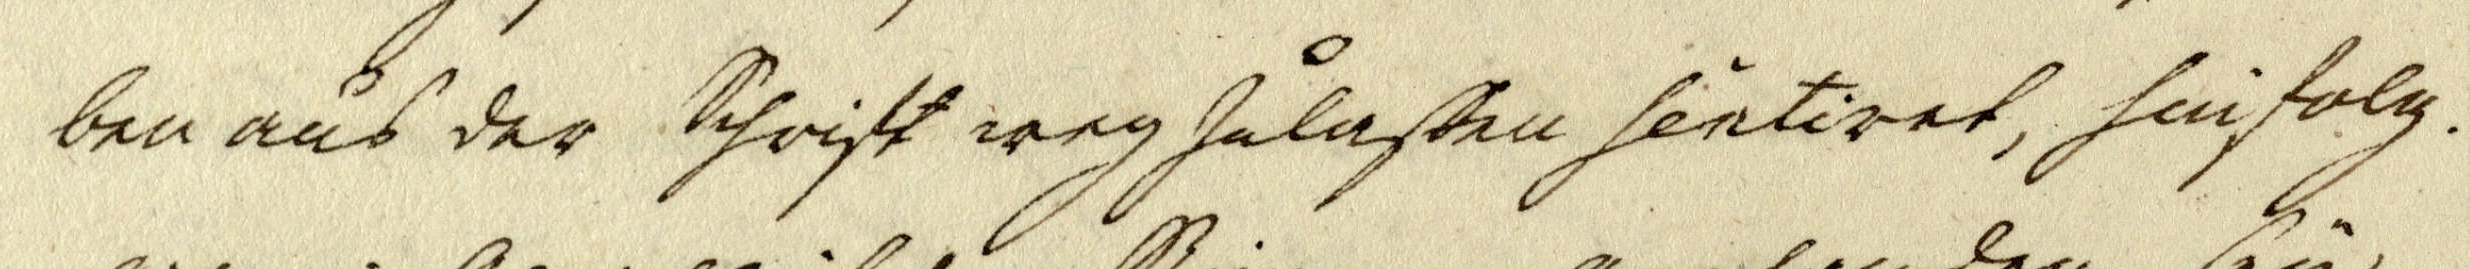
ben aus der Schrift wegzulassen sentiret, hinfolg¬
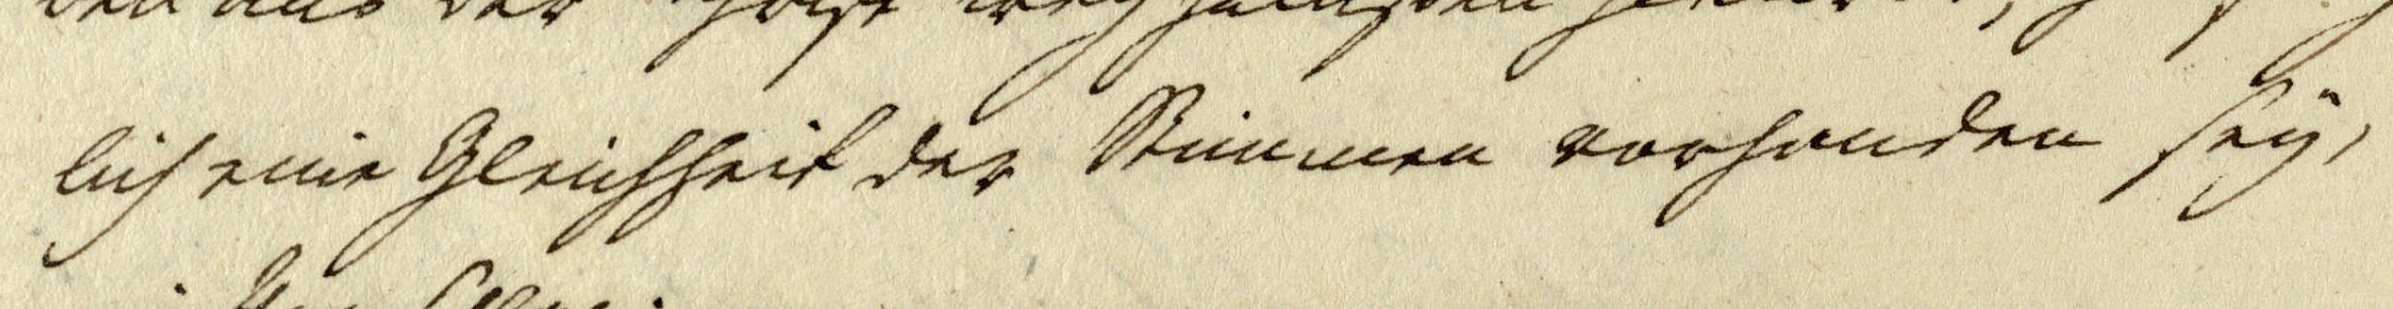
lich eine Gleichheit der Stimmen vorhanden seÿ,
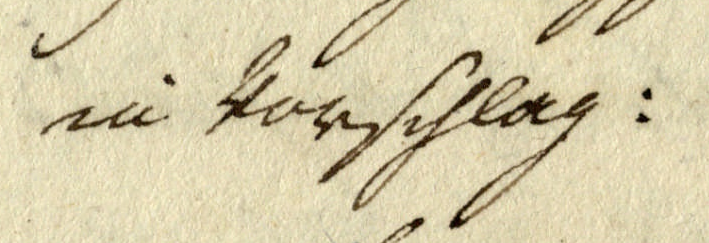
in Vorschlag:
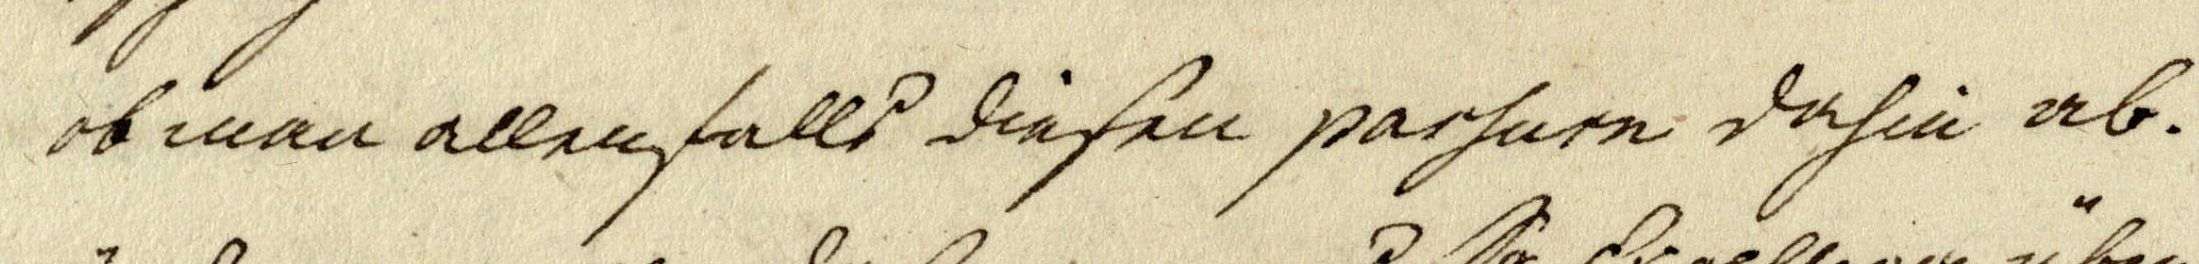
ob man allenfalls diesen passum dahin ab¬
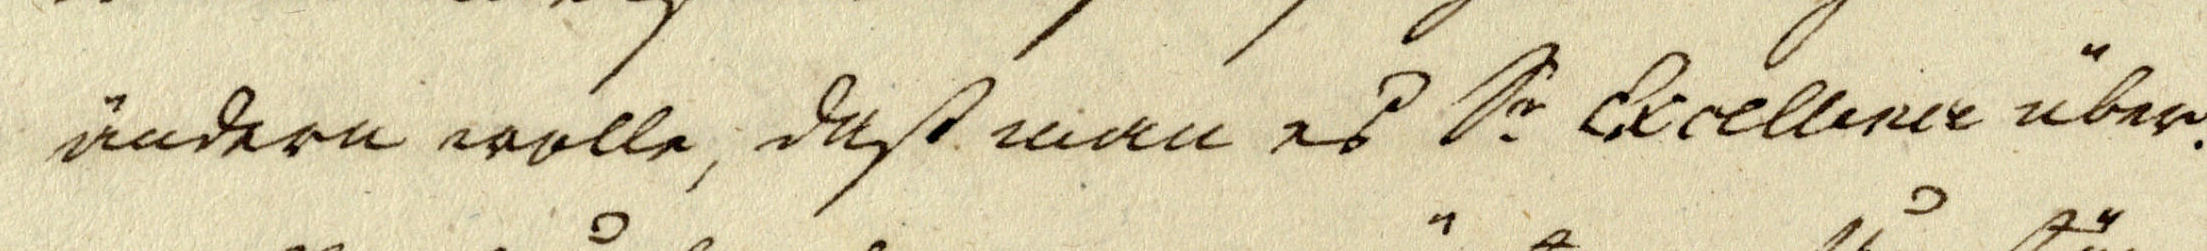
ändern wolle, daß man es Sr Excellence über¬
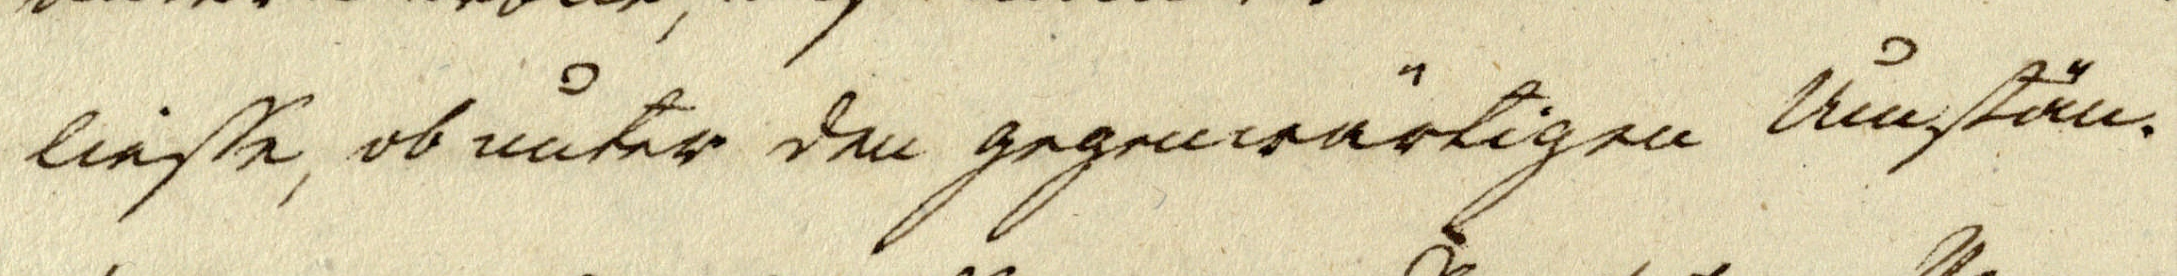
liesse, ob unter den gegenwärtigen Umstän¬
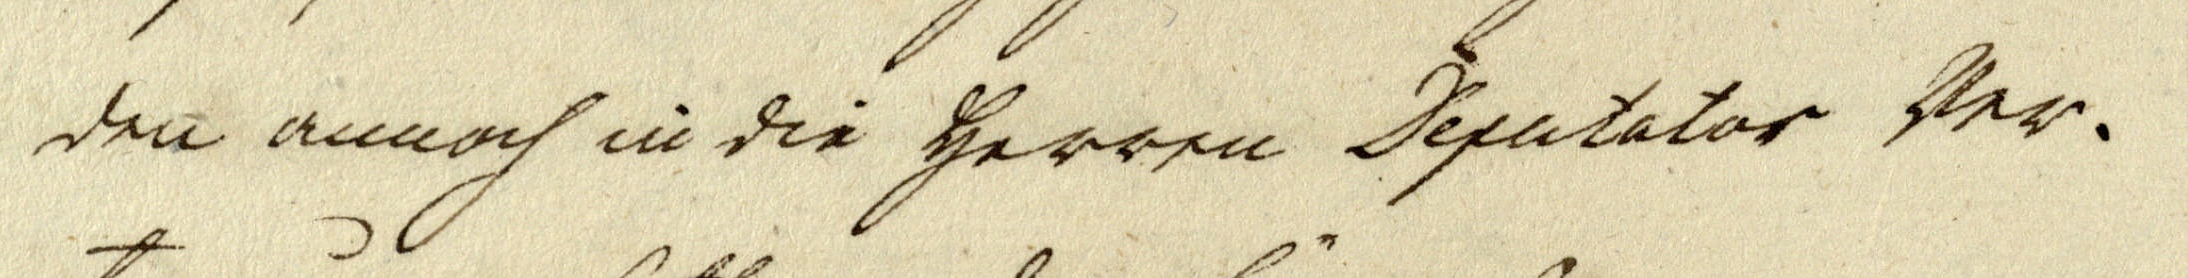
den annoch in die Herren Deputatos Ver¬
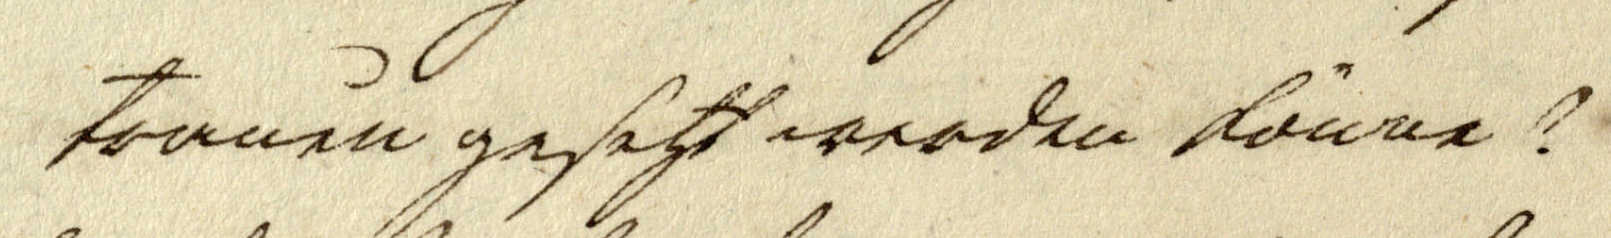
trauen gesetzt werden könne?
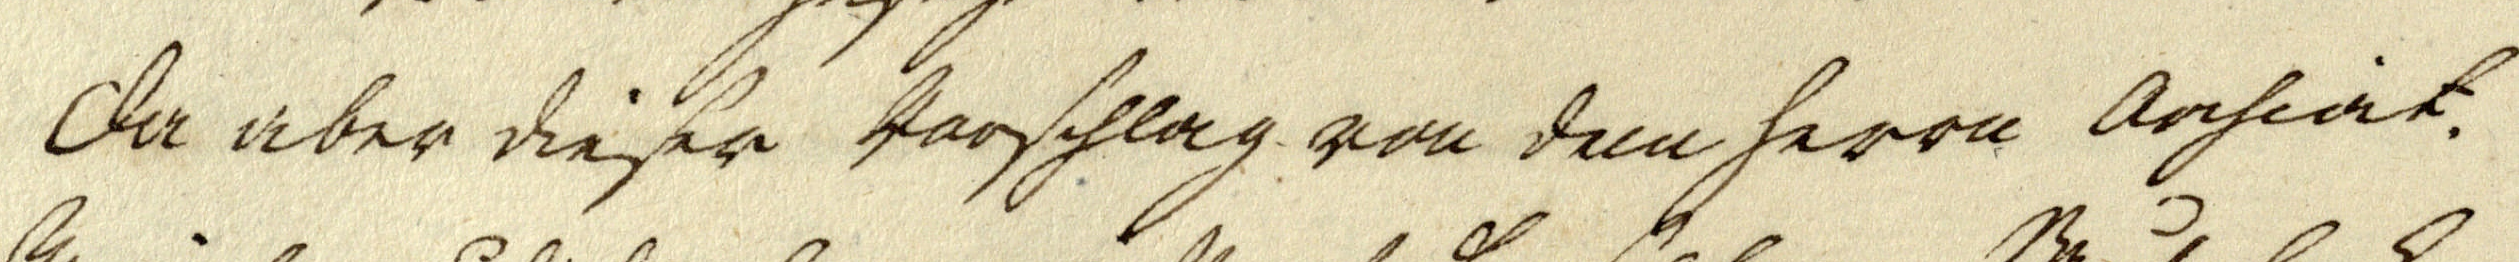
Da aber dieser Vorschlag von dem Herrn Archiat.
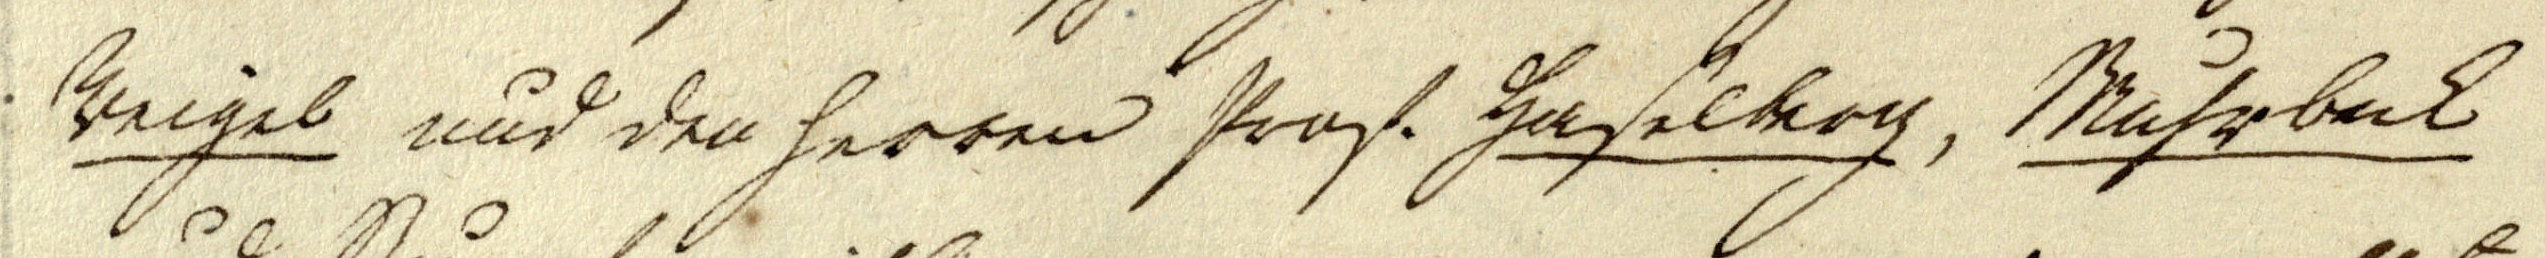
Weigel und den Herren Prof. Haselberg, Muhrbeck.
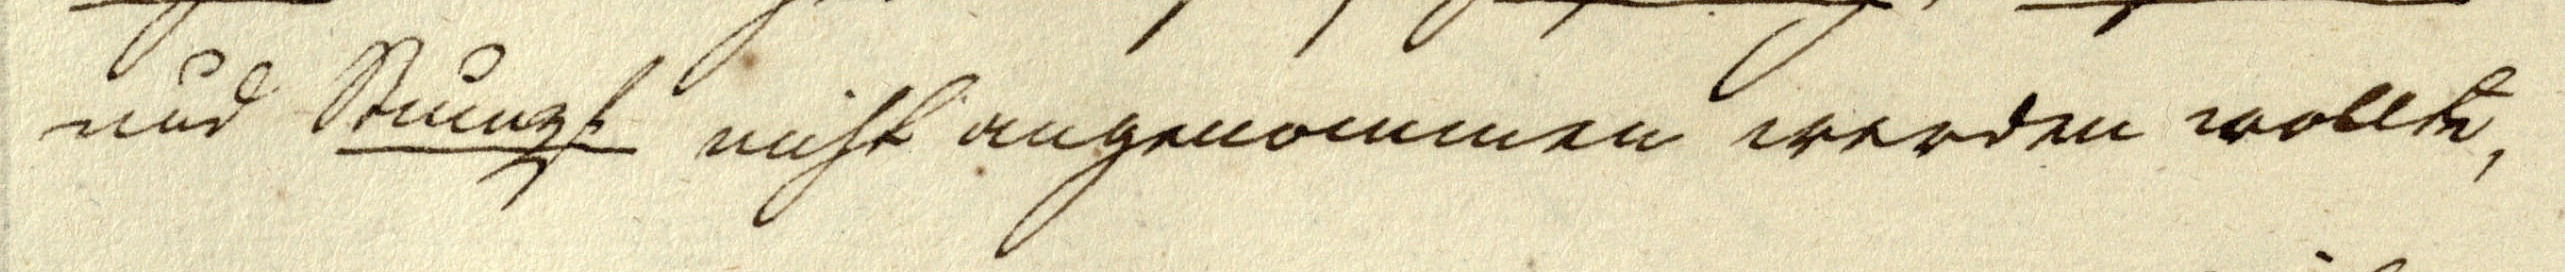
und Stumpf nicht angenommen werden wollte,
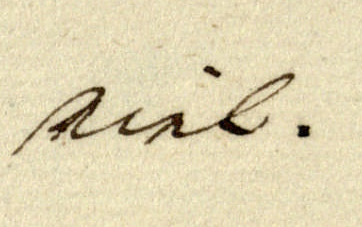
viel
